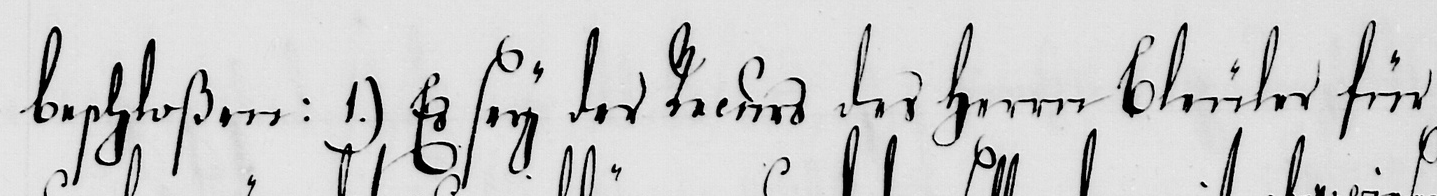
eschloßen: 1.) Es sey der Recurs des Herrn Bleuler für
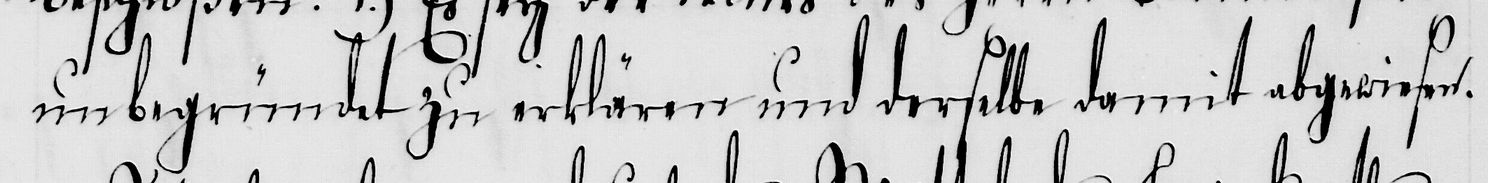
unbegründet zu erklären und derselbe damit abgewie¬
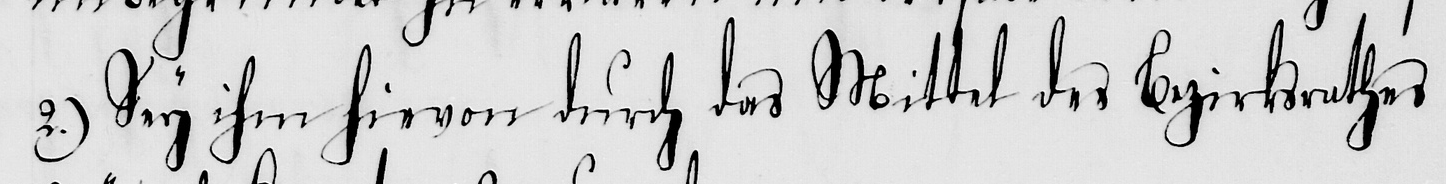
2.) Sey ihm hievon durch das Mittel des Bezirksrathes
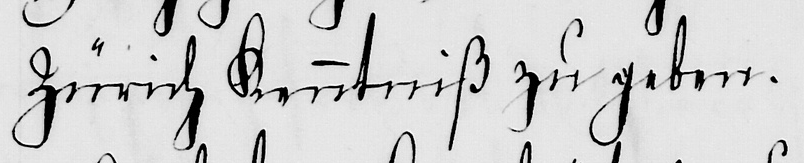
Zürich Kenntniß zu geben.
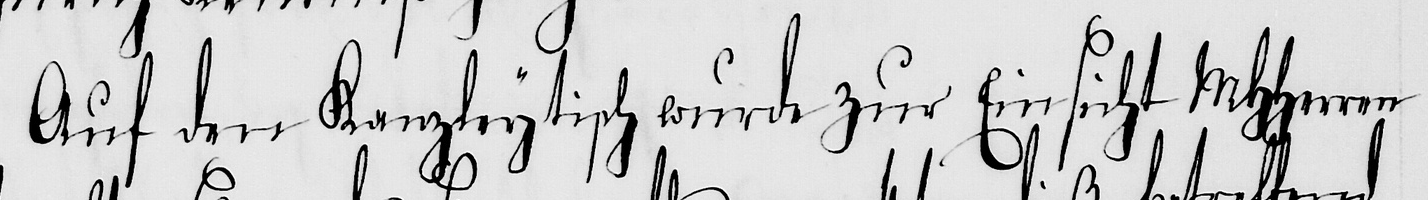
Auf den Kanzleytisch wurde zur Einsicht MHHerren
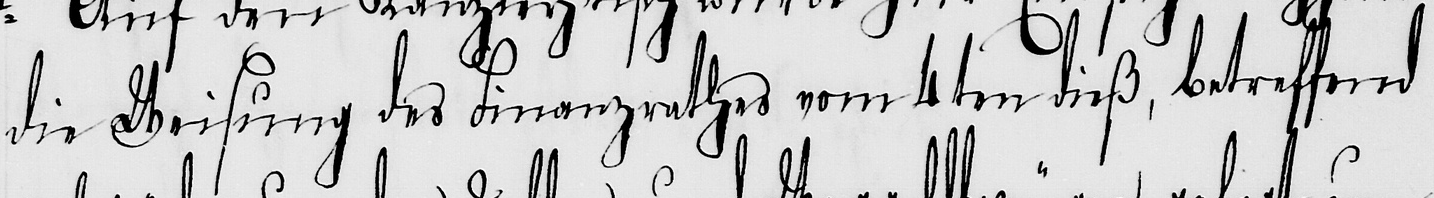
die Weisung des Finanzrathes vom 4ten dieß, betreffend
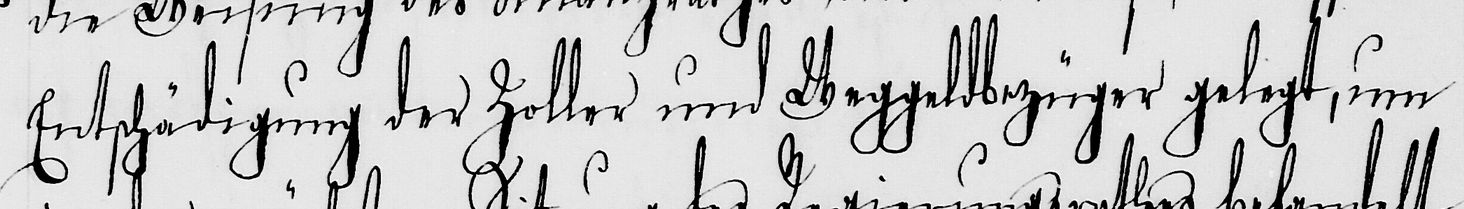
Entschädigung der Zoller und Weggeldbezüger gelegt, um
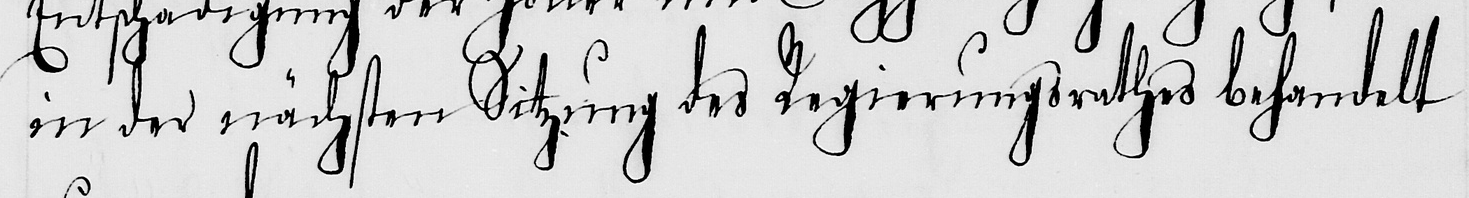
in der nächsten Sitzung des Regierungsrathes behandelt
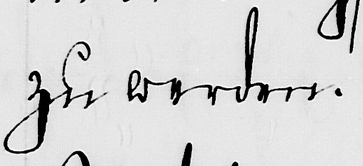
zu werden.
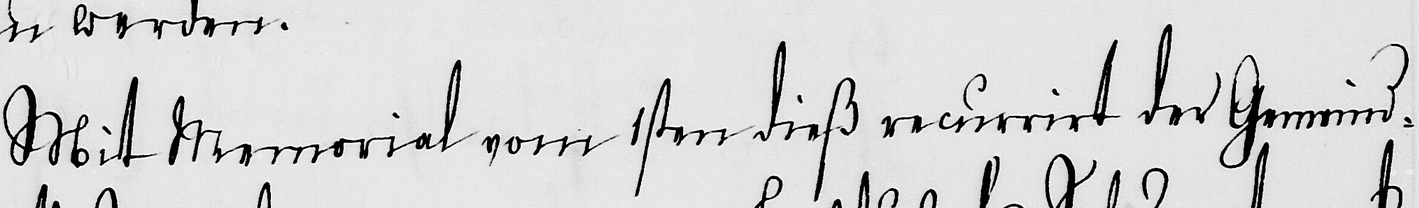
Mit Memorial vom 1sten dieß recurrirt der Gemeind¬
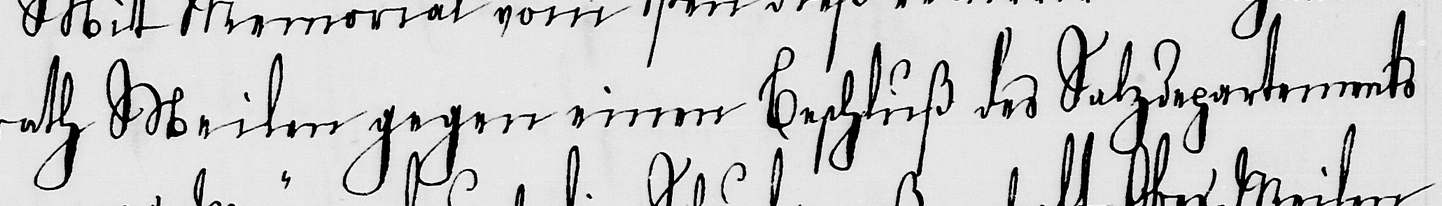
rath Meilen gegen einen Beschluß des Salzdepartements
